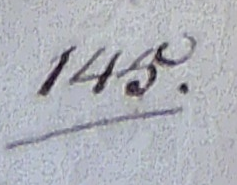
145.
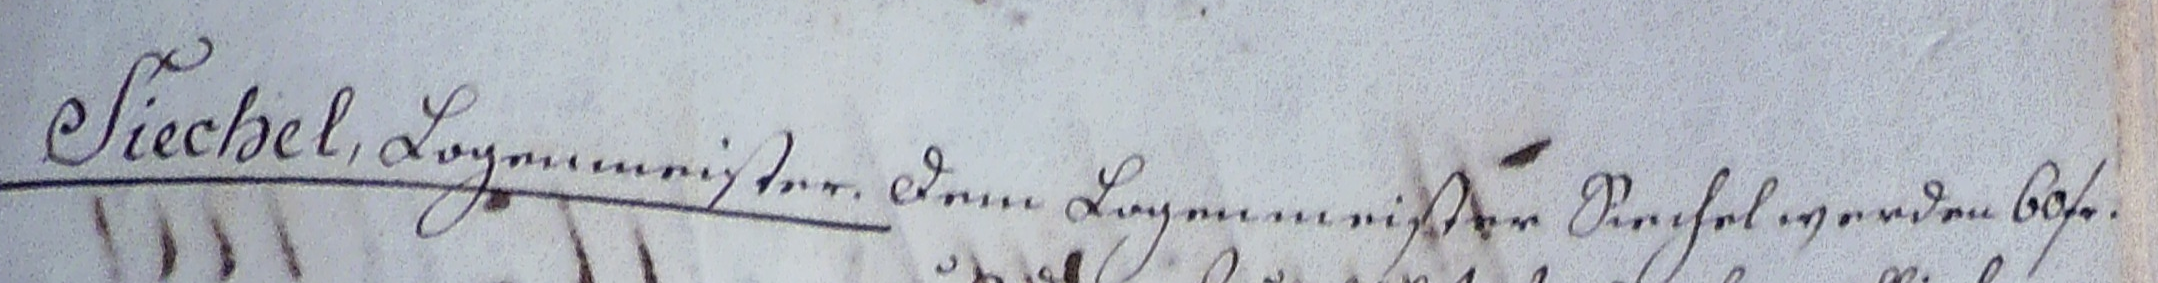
Siechel, Logenmeister. Dem Logenmeister Siechel werden 60fr.
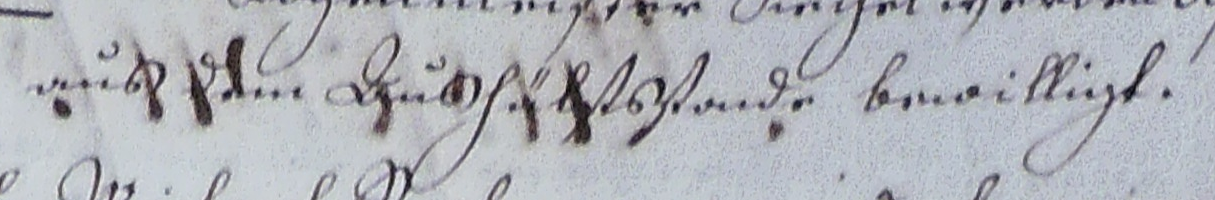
aus dem Aushülfsfonde bewilligt.
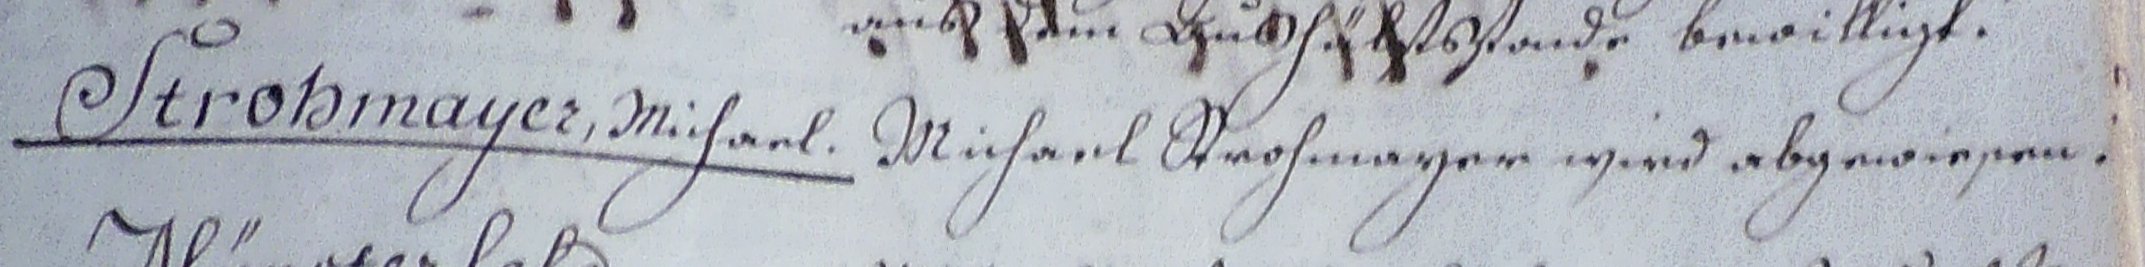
Strohmayer,Michael. Michael Strohmayer wird abgewiesen.
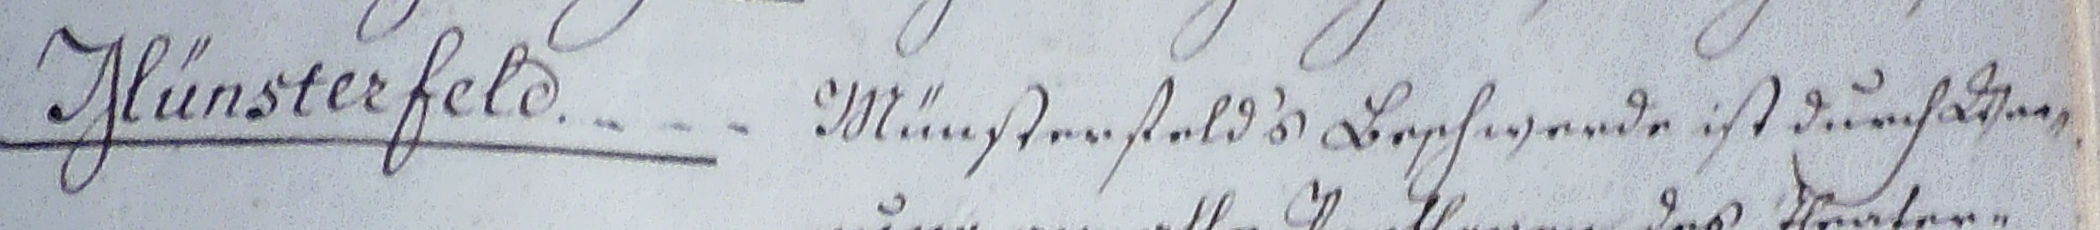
Münsterfeld. .. .. .. Münsterfeld's Beschwerde ist durch War¬
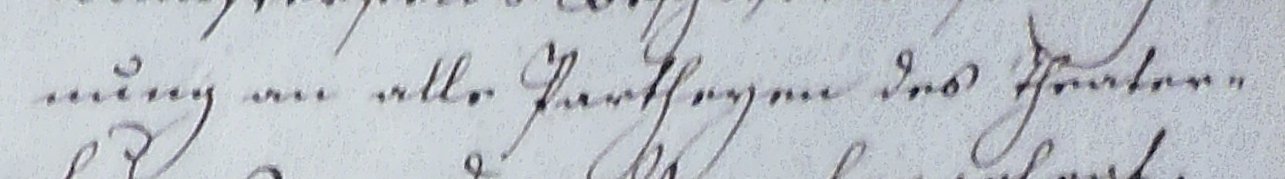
nung an alle Partheyen des Theater¬
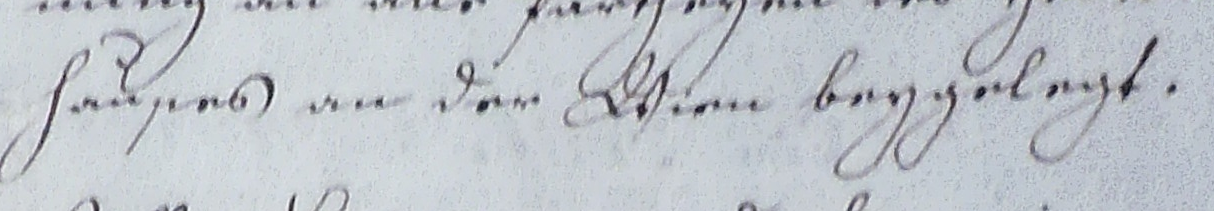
hauses an der Wien beygelegt.
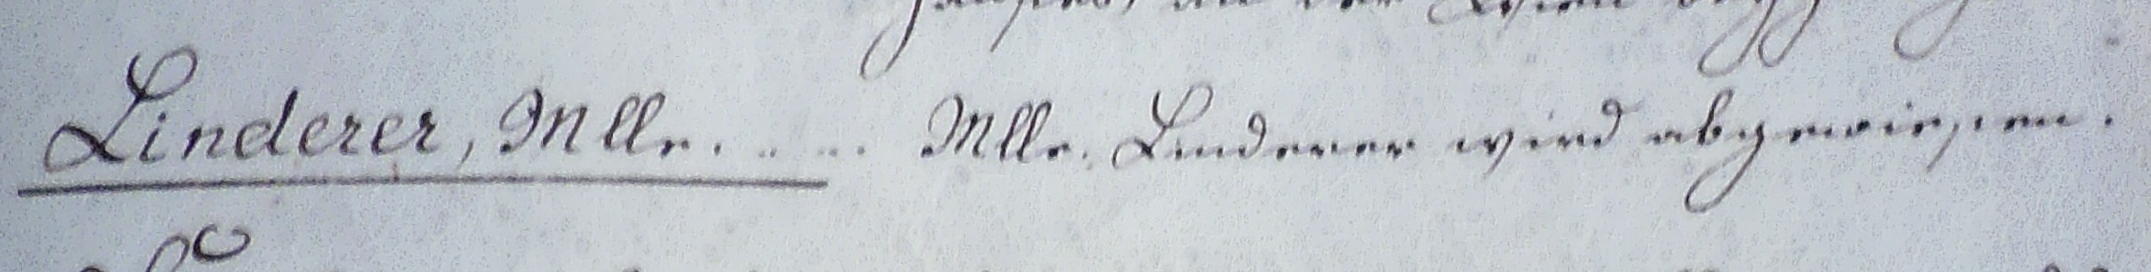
Linderer, Mlle. .. .. Mlle. Linderer wird abgewiesen.
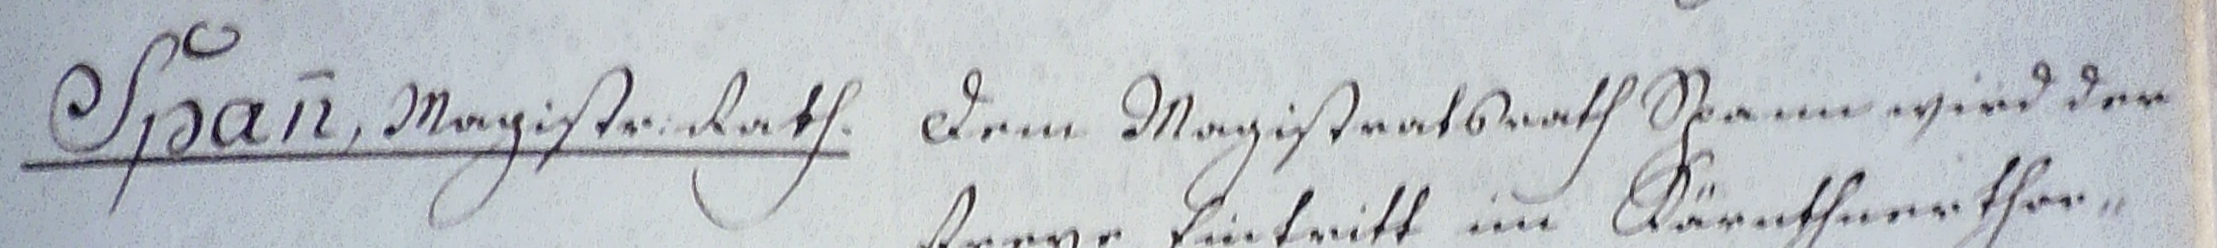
Span̅, Magistr. Rath. Dem Magistratsrath Spann wird der
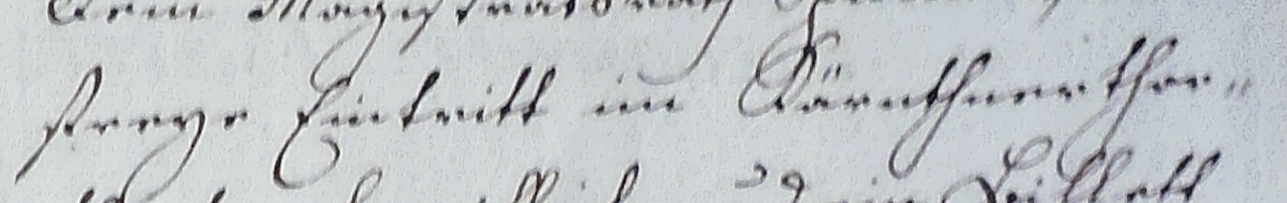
freye Eintritt im Kärnthnerthor¬
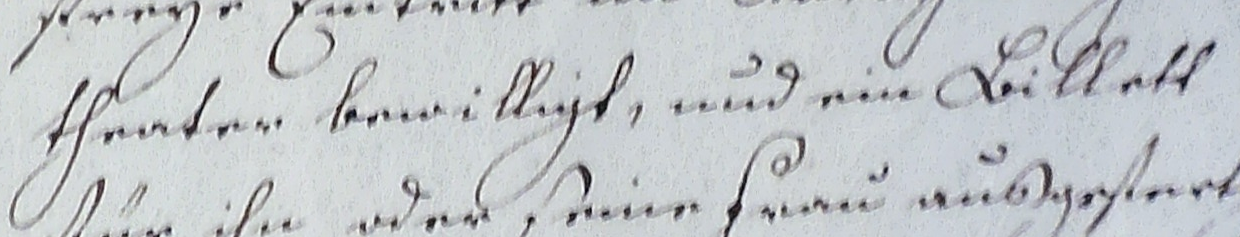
theater bewilligt, und ein Billett
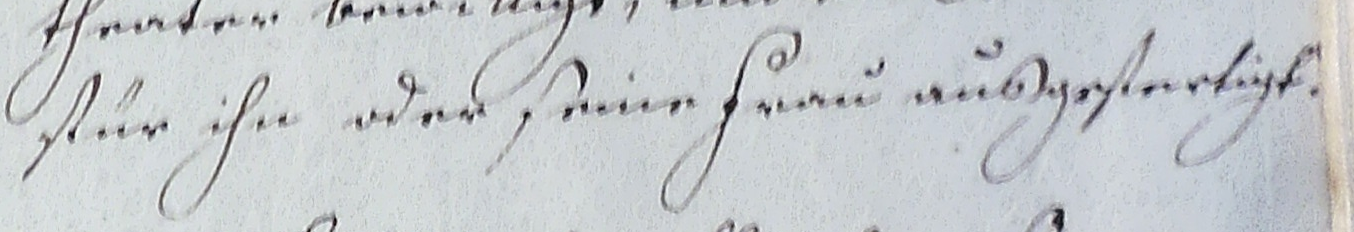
für ihn oder seine Frau ausgefertigt.
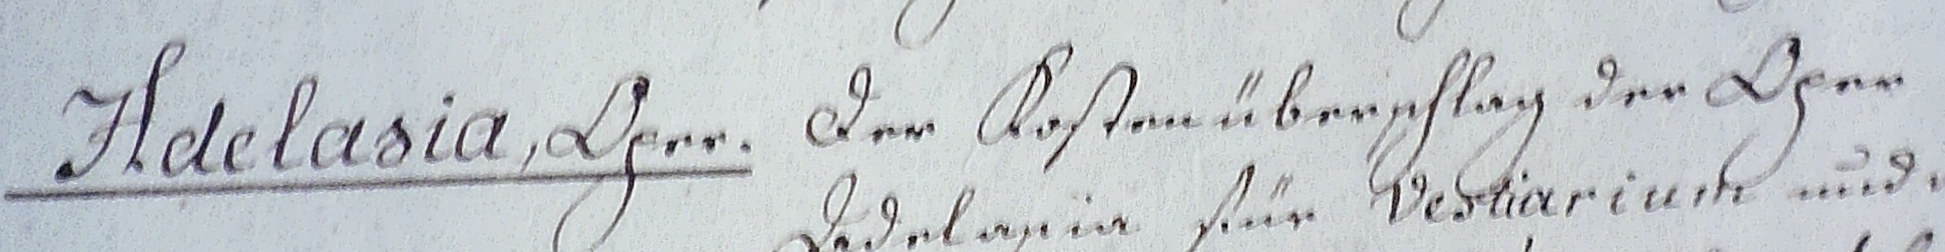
Adelasia, Oper. Der Kostenüberschlag der Oper
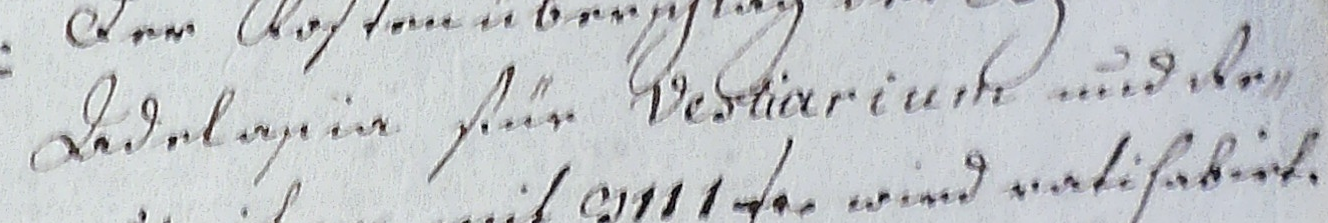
Adelasia für Vestiarium und Re¬
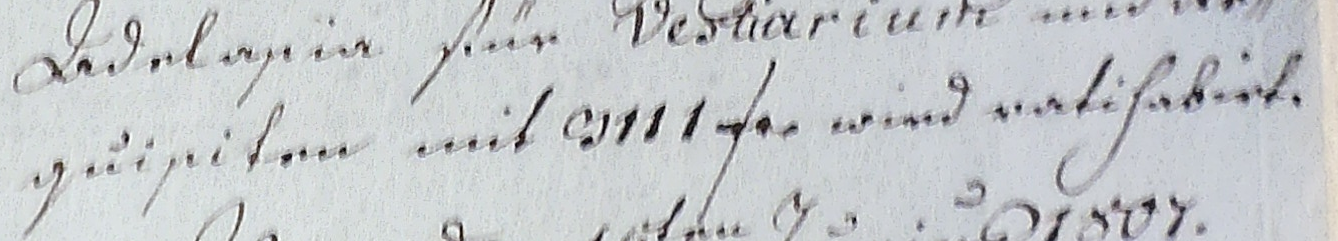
quisiten mit 3111fr. wird ratihabirt.
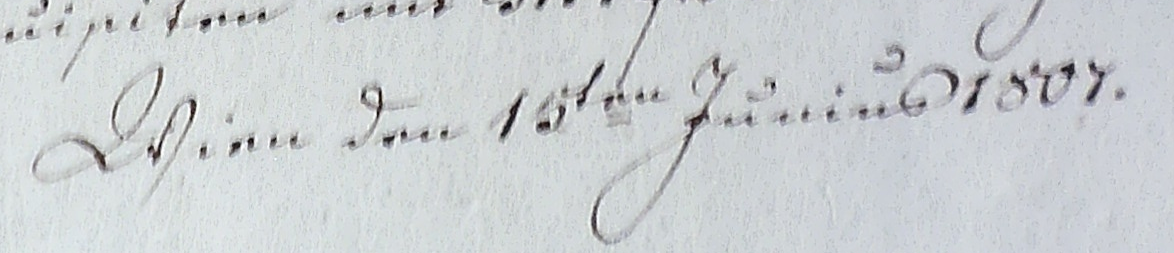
Wien den 15te͇n Junius und 1807.
